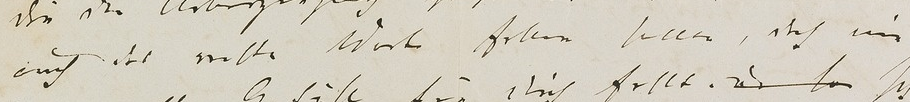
auch das rechte Wort fehlen sollte, doch nie
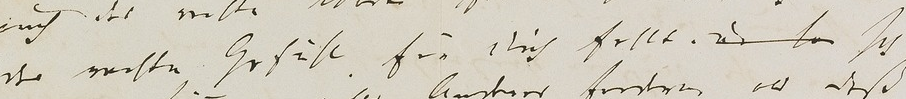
das rechte Gefühl für dich fehlt. u. so Ich
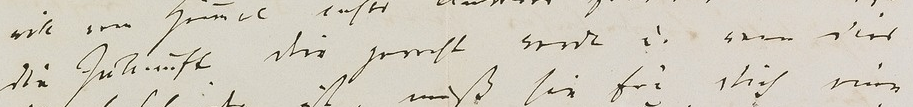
die Zukunft dir gerecht werde u. wenn dies
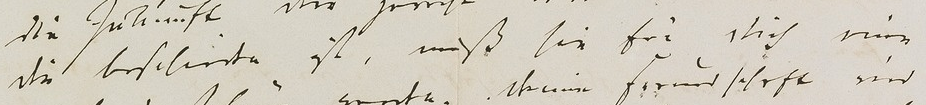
dir beschieden ist, muß sie für dich eine
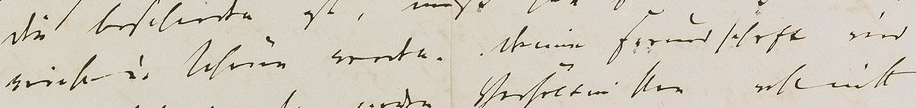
reiche u. schöne werden. Deine Freundschaft wird
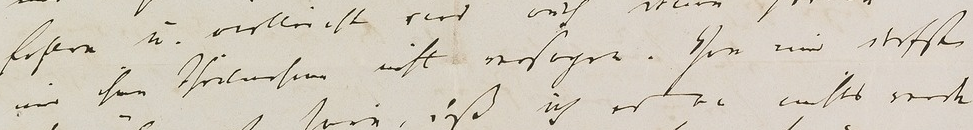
mir ihre Theilnahme nicht versagen. Von mir darfst
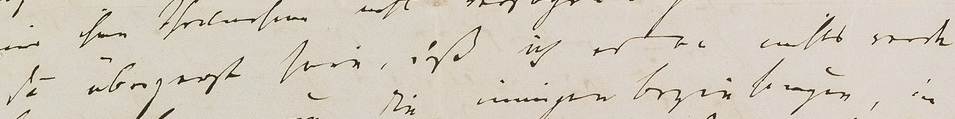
du überzeugt sein, daß ich es an nichts werde
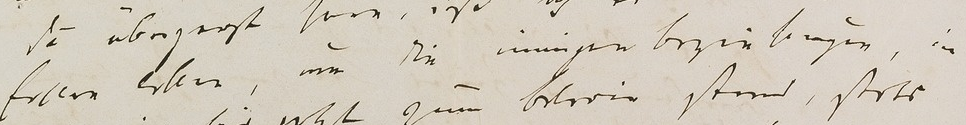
fehlen lassen, um die innigen Beziehungen, in
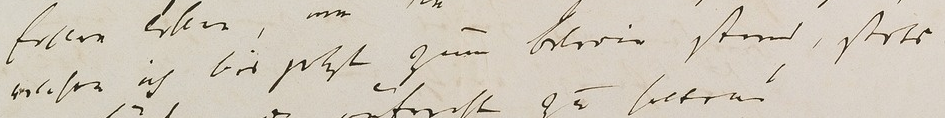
welchen ich bis jetzt zum Belvoir stand, stets
